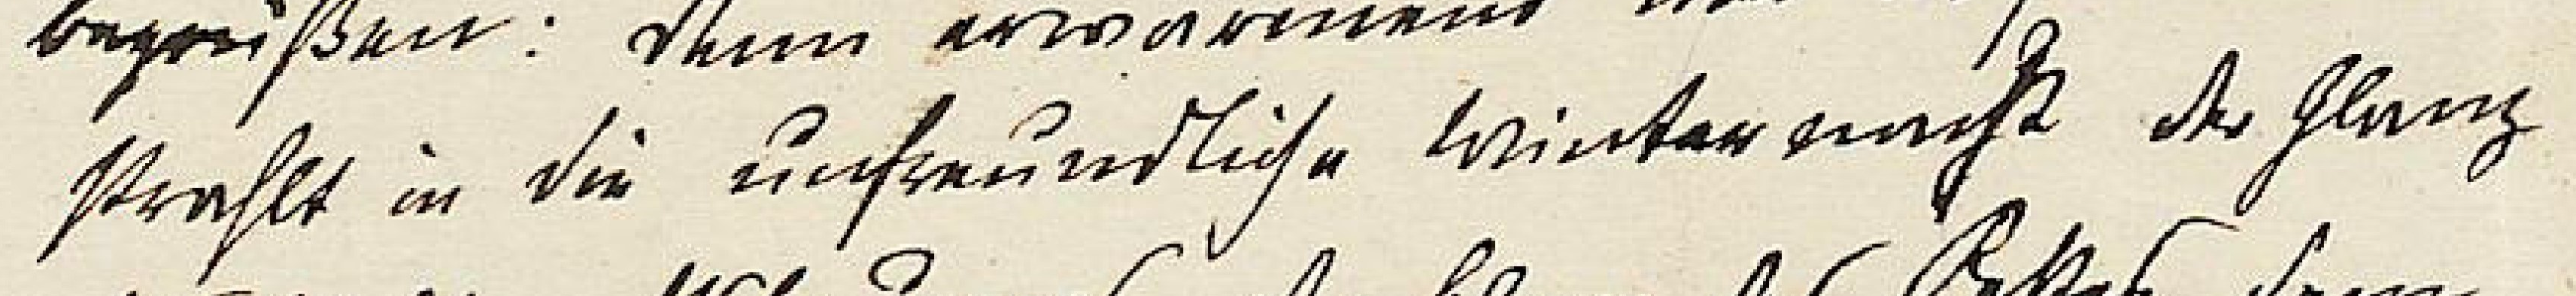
strahlt in die unfreundliche Winternacht, der Glanz
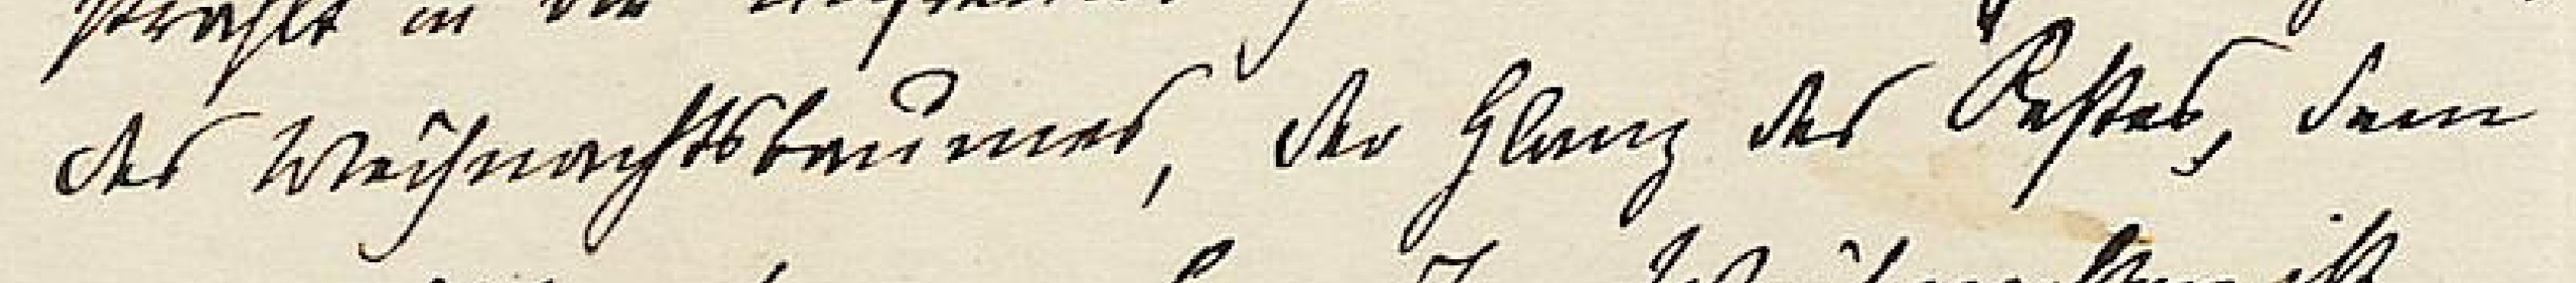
des Weihnachtsbaumes, der Glanz des Festes, dem
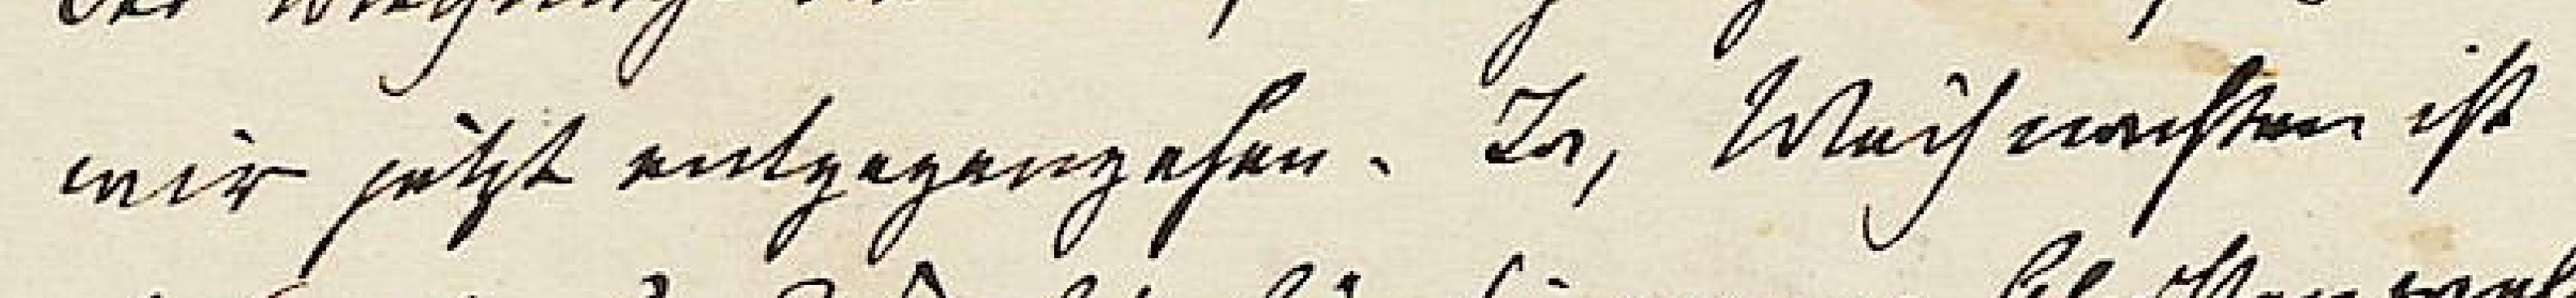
wir jetzt entgegengehen. Ja, Weihnachten ist
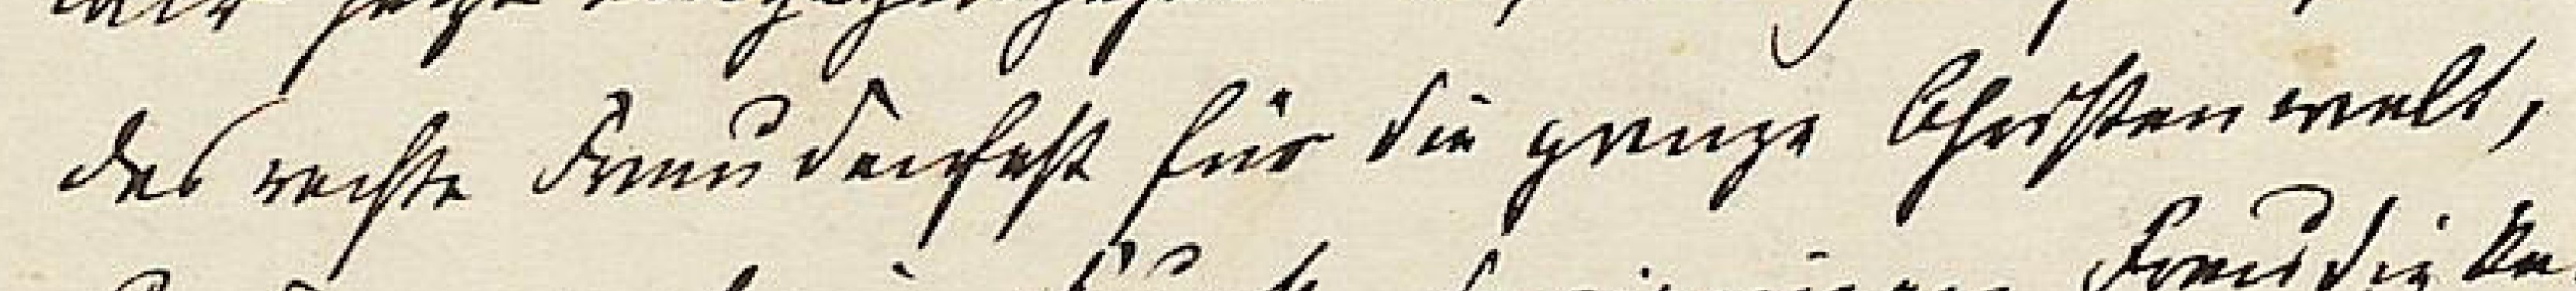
das rechte Freudenfest für die ganze Cchristenwelt,
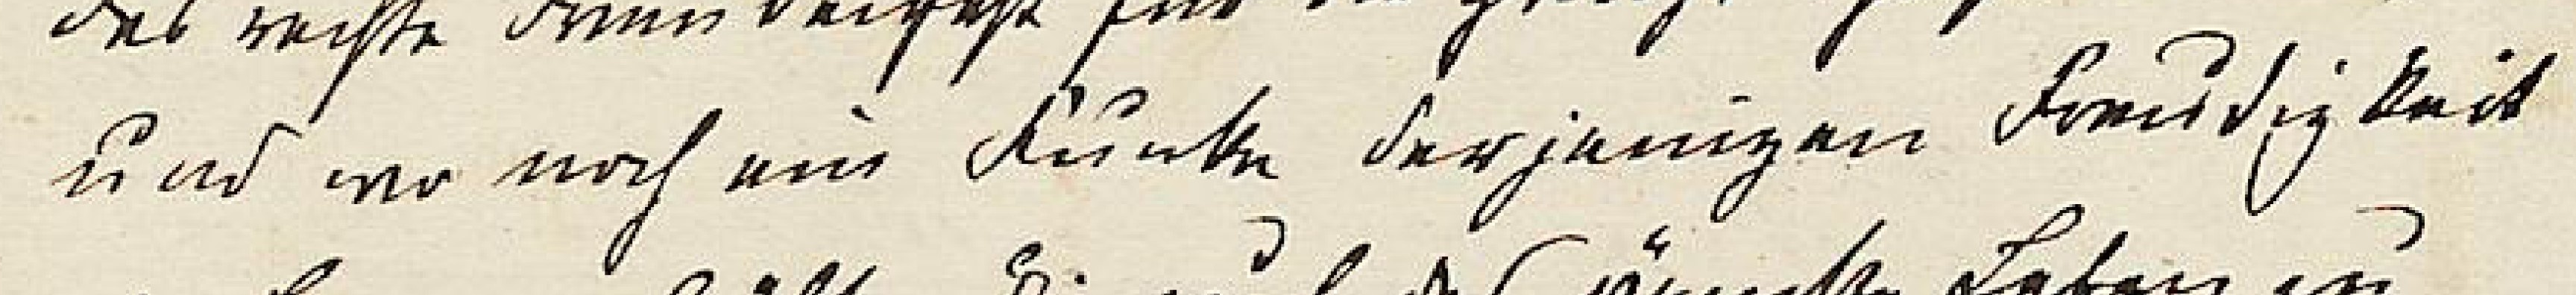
und wo noch ein Funke derjenigen Freudigkeit
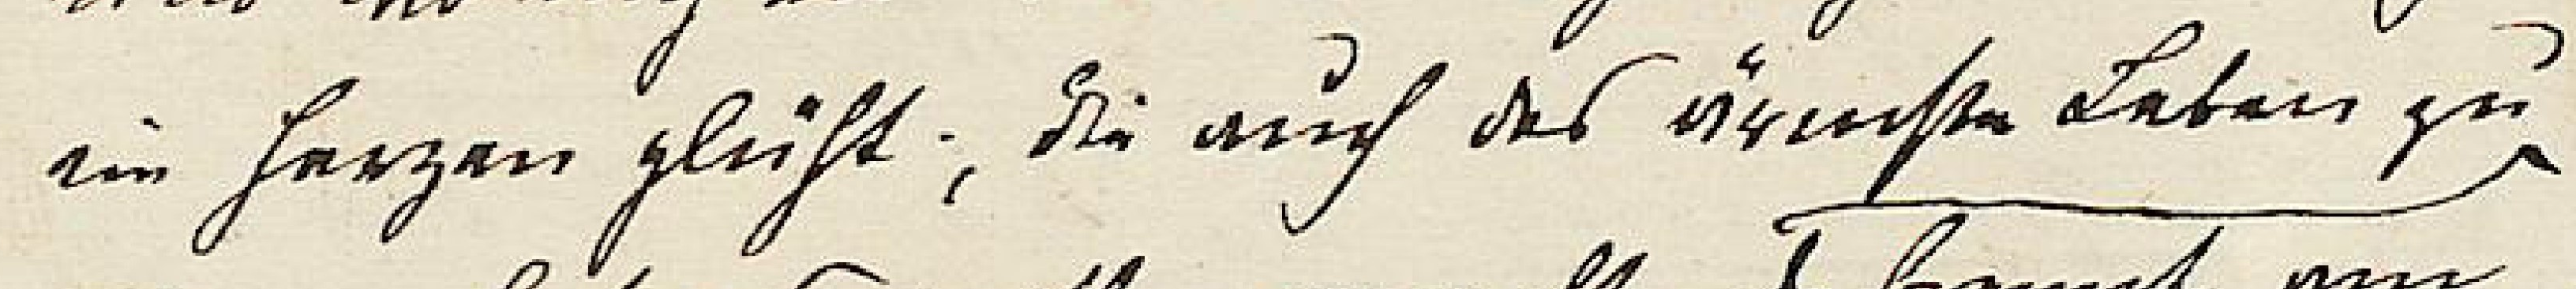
in Herzen glüht, die auch das ärmste Leben zu
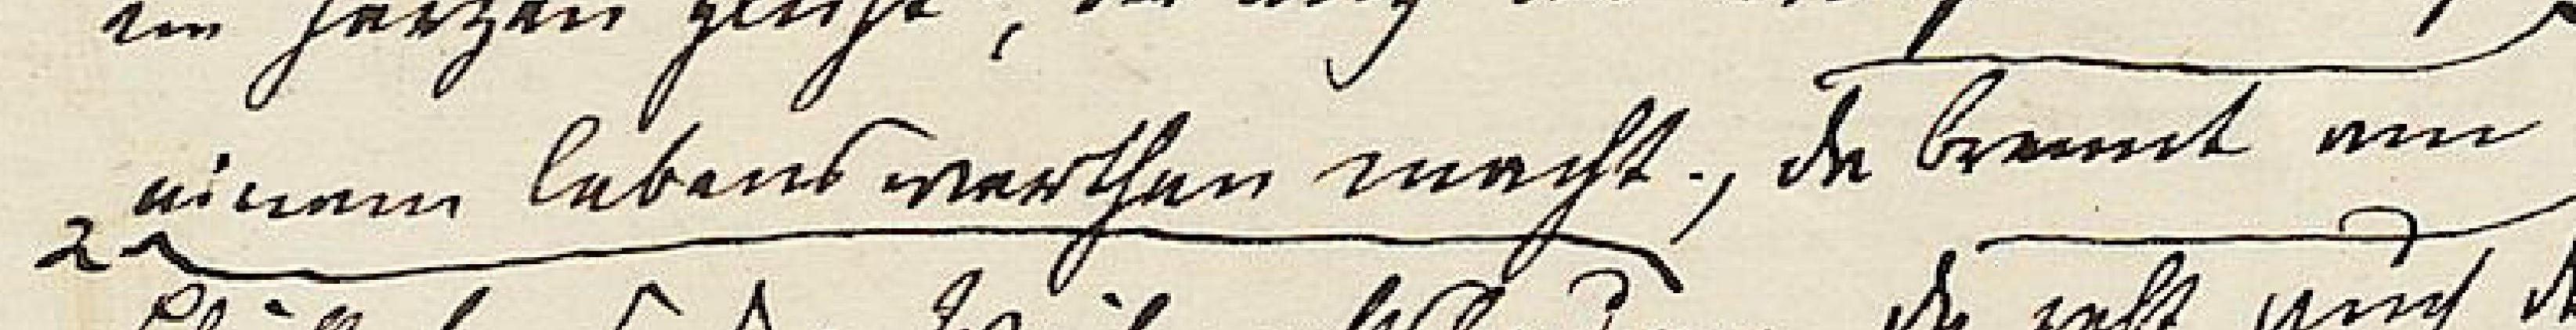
2 einem lebenswerthen macht, da brennt am
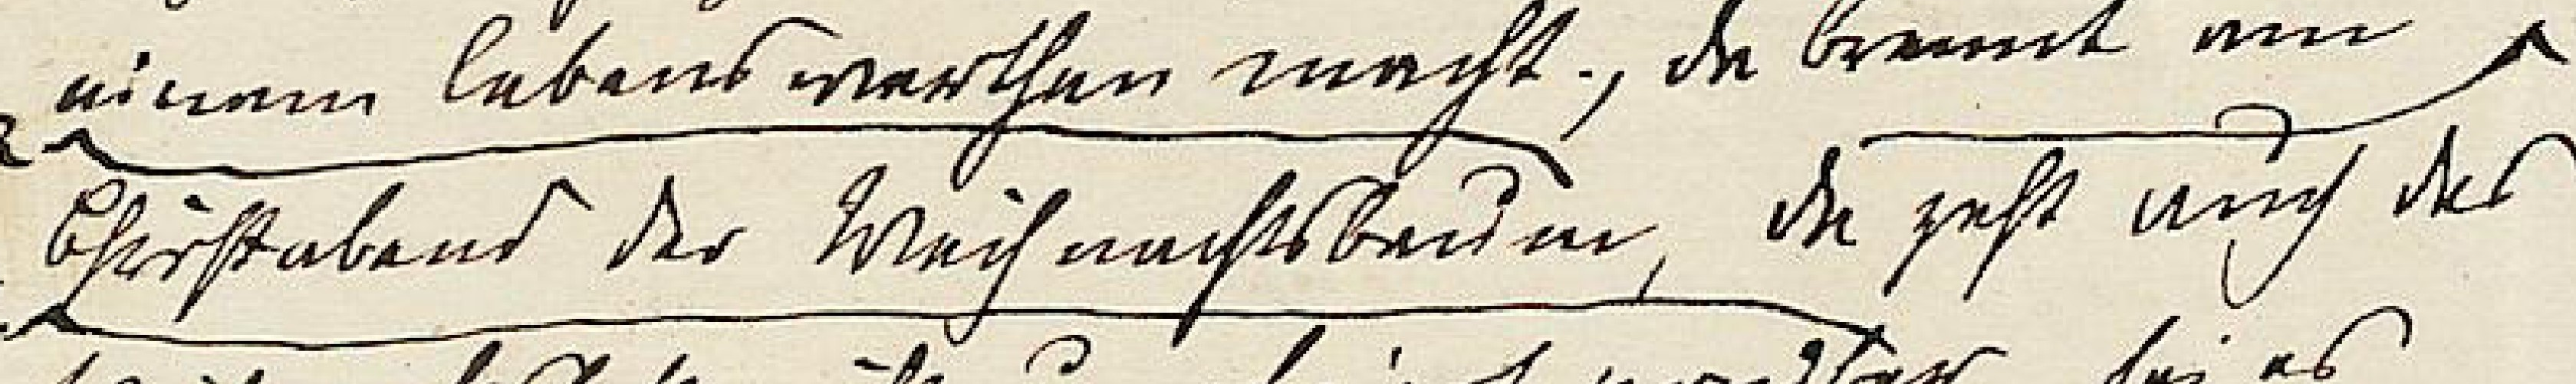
Christabend der Weichnachtsbaum, da geht auch das
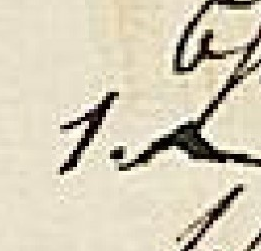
1.
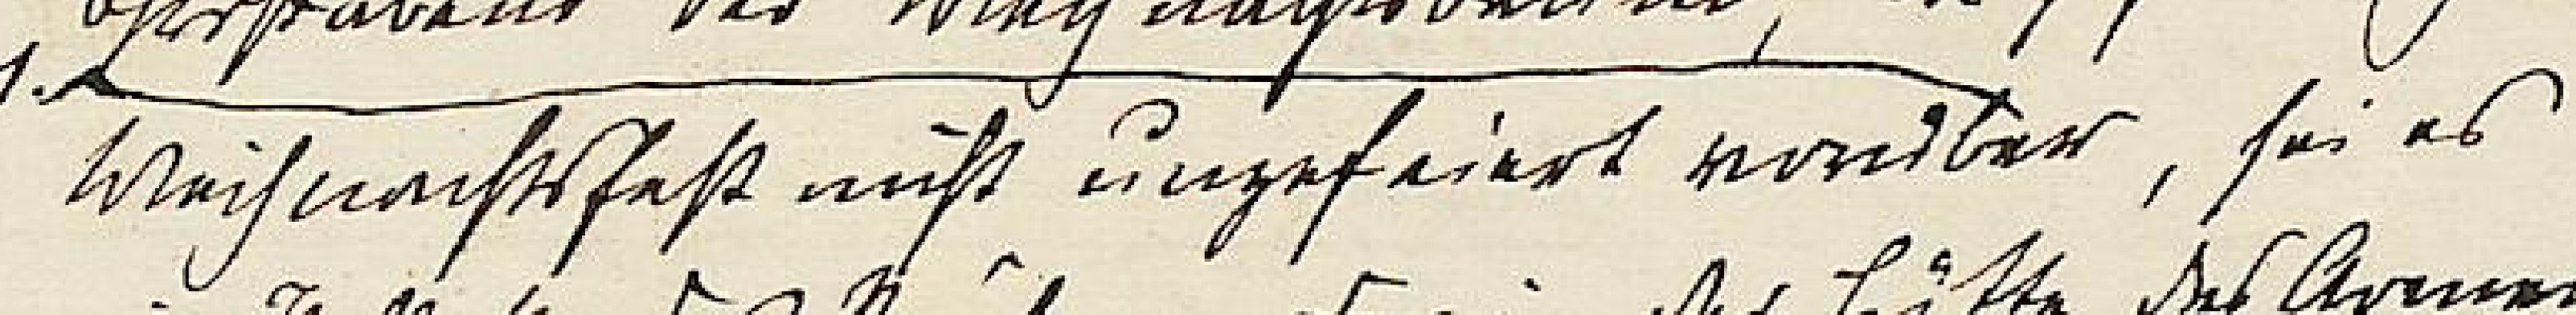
Weihnachtsfest nicht ungefeiert vorüber, sei es
